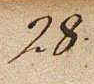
28.
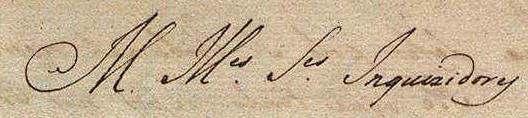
M. Ill.es S.ers Inquizidores
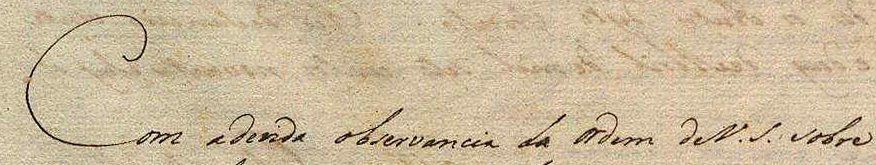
Com adenda observancia da ordem de V. S. sobre
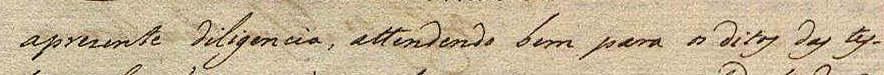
a prezente diligencia, attendendo bem para os ditos das tes
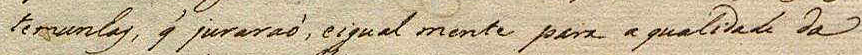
temunhas, q̄ juraraõ, e igualmente para a qualidade da
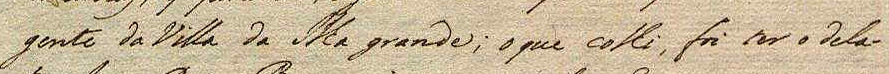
gente da Villa da Ilha grande; o que colhi, foi ter o dela
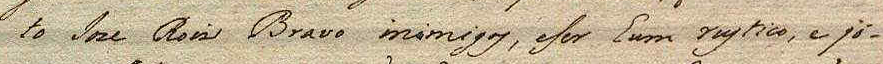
to Ioze Roiz Bravo inimigos, ser hum rustico, e jo
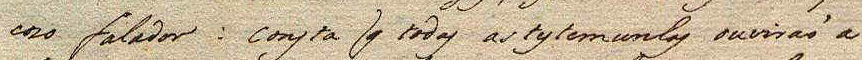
cozo falador: consta q̄ todas as testemunhas ouviraõ a
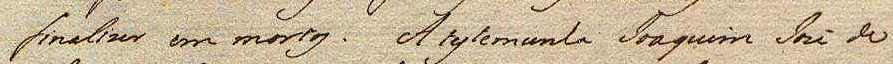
finalizer em mortos. A testemunha Ioaquim Iozé de
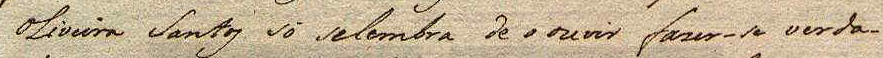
oLiveira Santos só se lembra de o ouvir fazer-se verda
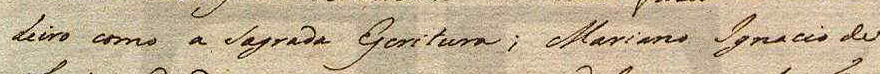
deiro como a sagrada Escritura; Mariano Ignacio de
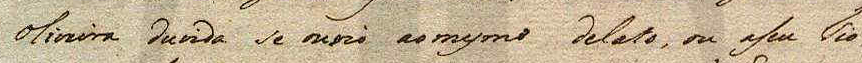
oliveira duvida se ouvio ao mesmo delato, ou a seu Tio
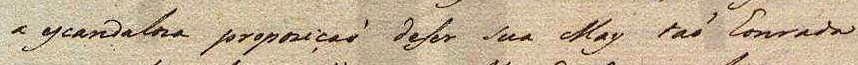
a escandaloza propoziçaõ de ser sua May taõ honrada
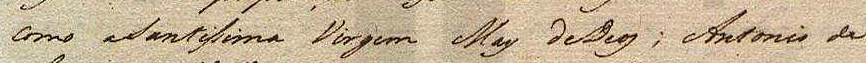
como a Santissima Virgem May de Deos; Antonio de
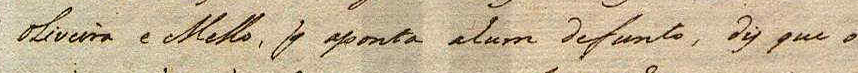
oliveira e Mello, q̄ aponta a hum defunto, dis que o
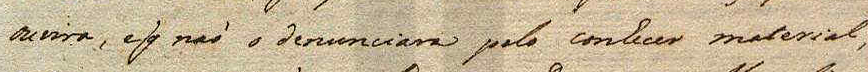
ouvira, e q̄ naõ o denunciara pelo conhecer material,
